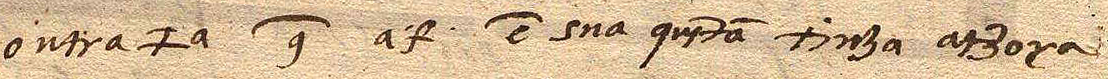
outra ta q̄ a .R. ē sua quj̄tā tinha a thora
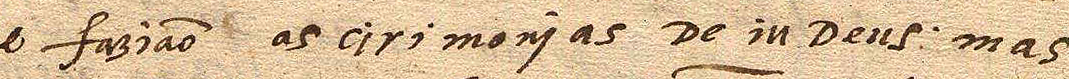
e fazião as cirimonjas De iuDeus. mas
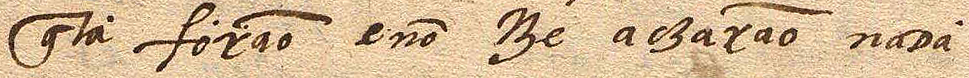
q̄ la forão e nō lhe acharão naDa
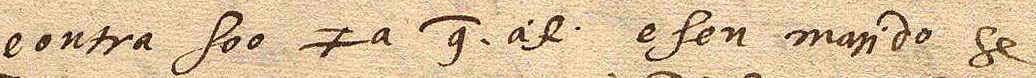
e outra soo ta q̄. a .R. e seu marido se
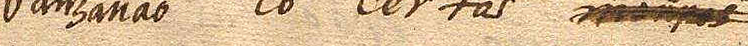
banhauão c̄o certos mouros
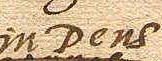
iuDeus
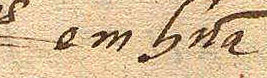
em huā
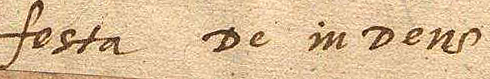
festa De iuDeus
